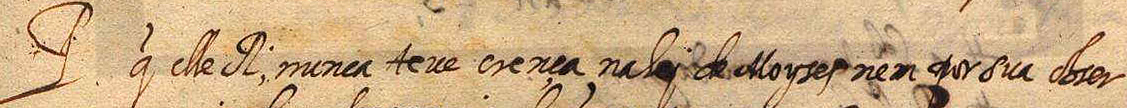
P. q̄ elle R; nunca teue crença na lej de Moyses nem por sua obser
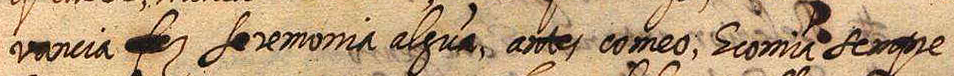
vancia fez seremonia alguā, antes comeo, E comia sempre
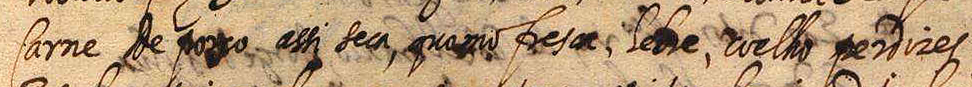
Carne de porco assi seca, quomo fresca, lebre, coelho perdizes
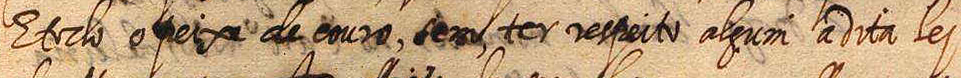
E todo o peixe de couro, sem ter respeito algum a dita lej
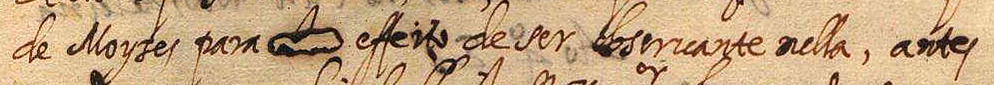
de Moyses para _ effeito de ser obseruante nella, antes
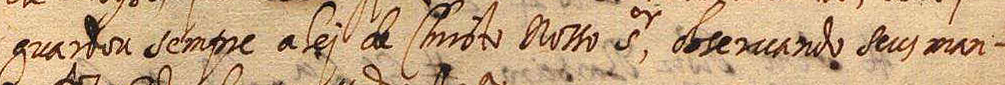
guardou sempre a lej de Chisto nosso sor, obseruando seus man
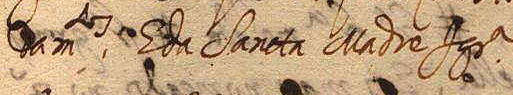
damtos, E da Sancta Madre Jgra.
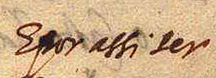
E por assi ser
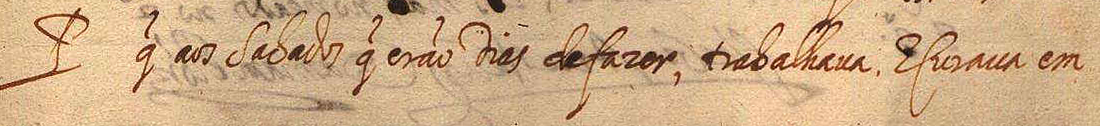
P q̄ aos Sabados q̄ erão dias de fazer, trabalhaua, E Curaua em
